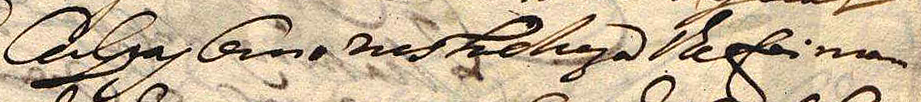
Culpas Como nesta Meza lhe foi man
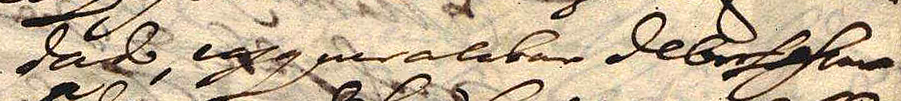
dado, e as que acabar de confessar
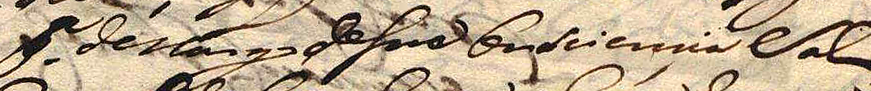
p.a descargo de sua Consciencia Sal
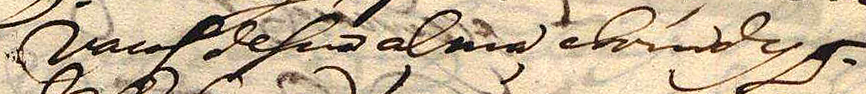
vaçaõ de sua alma, e bom desp.o
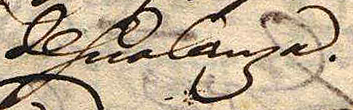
de sua Cauza?
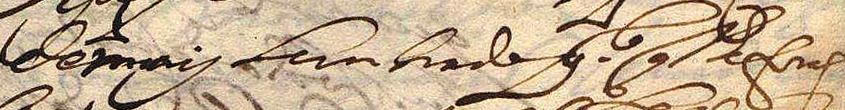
de mais lembrado p.lo q̄ lhe foraõ
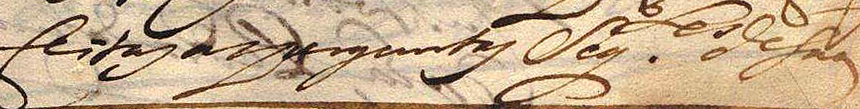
feitas as perguntas Seg.tes de sua
